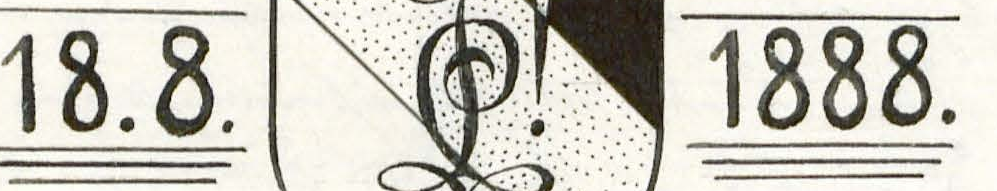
18.8.
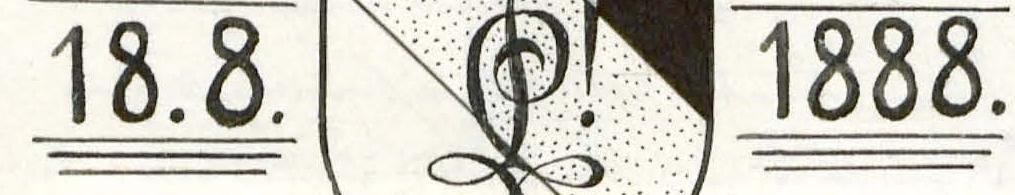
1888.
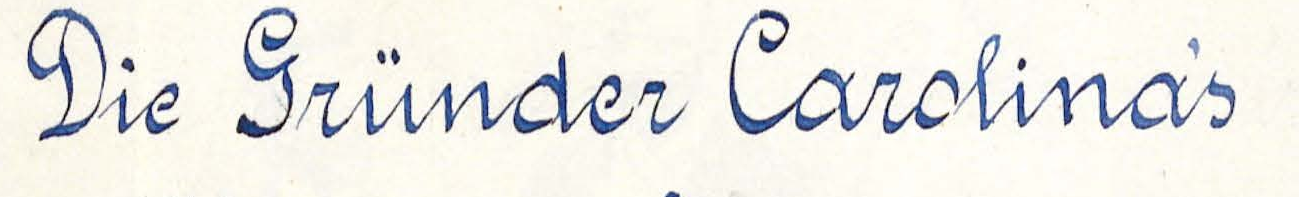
Die Gründer Carolina's
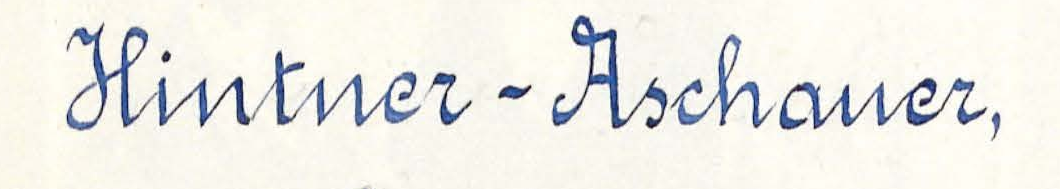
Hintner-Aschauer,
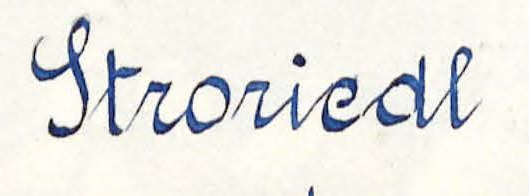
Stroriedl
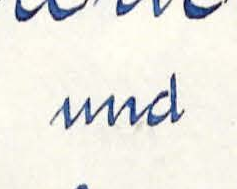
und
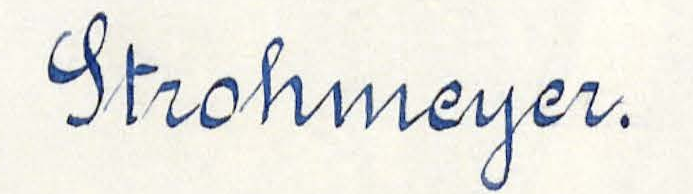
Strohmeyer.
